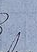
so.
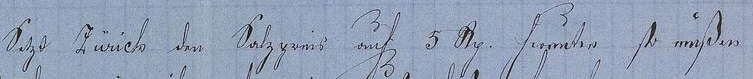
Setzt Zürich den Salzpreis auf 5 Rp. herunter so müßen
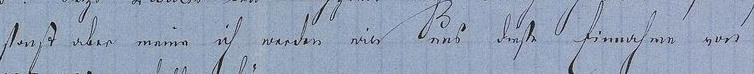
sonst aber meine ich werden wir uns diese Einnahme von
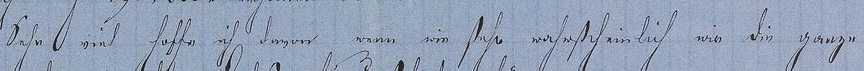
Sehr viel hoffe ich davon wenn wie sehr wahrscheinlich wir die ganze
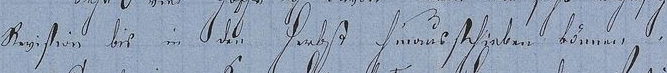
Revision bis in den Herbst hinausschieben können.
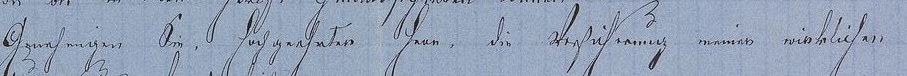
Genehmigen Sie, hochgeehrter Herr, die Versicherung meiner wirklichen
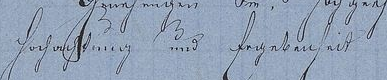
Hochachtung und Ergebenheit.
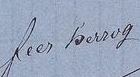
Feer Herzog
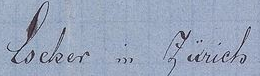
Herrn Dr. Alfred
